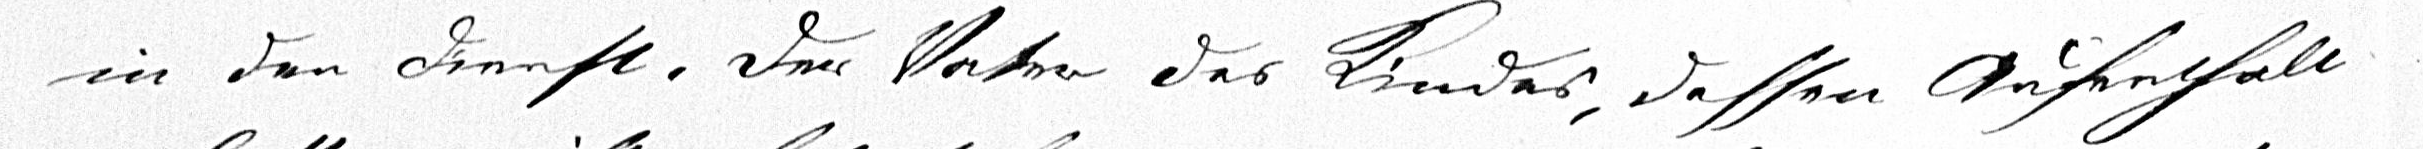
in den Dienst, der Vater des Kindes, dessen Aufenthalt
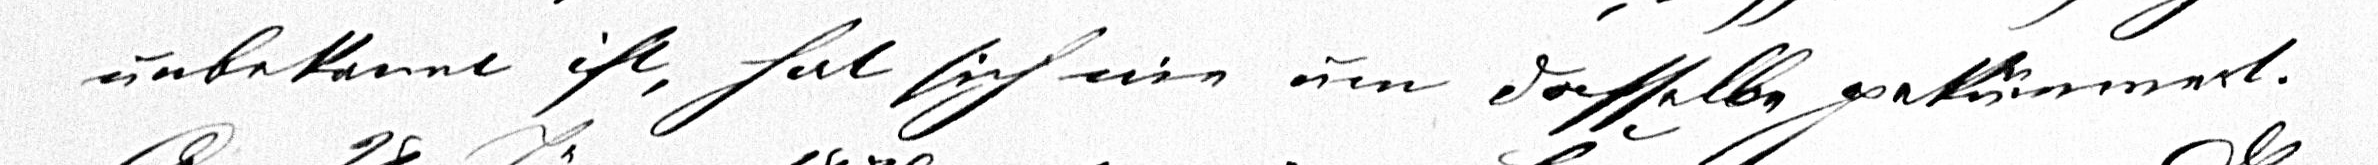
unbekannt ist, hat sich xx um dasselbe gekümmert.
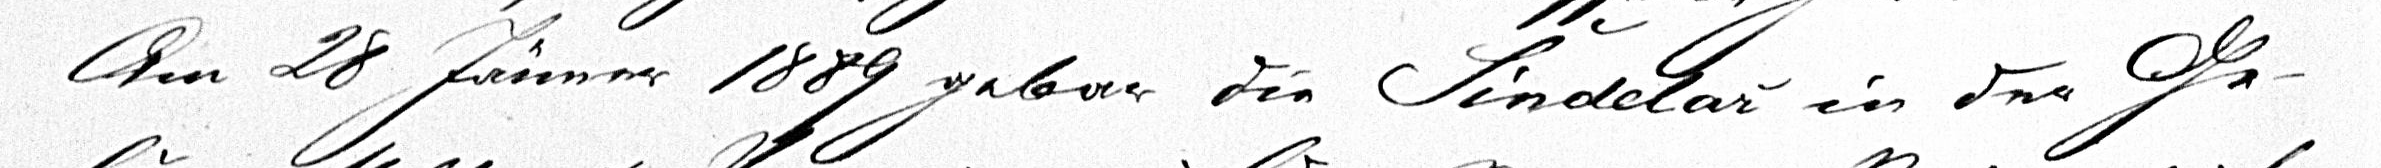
Am 28 Jänner 1889 gebar die Šindelař in der Ge¬
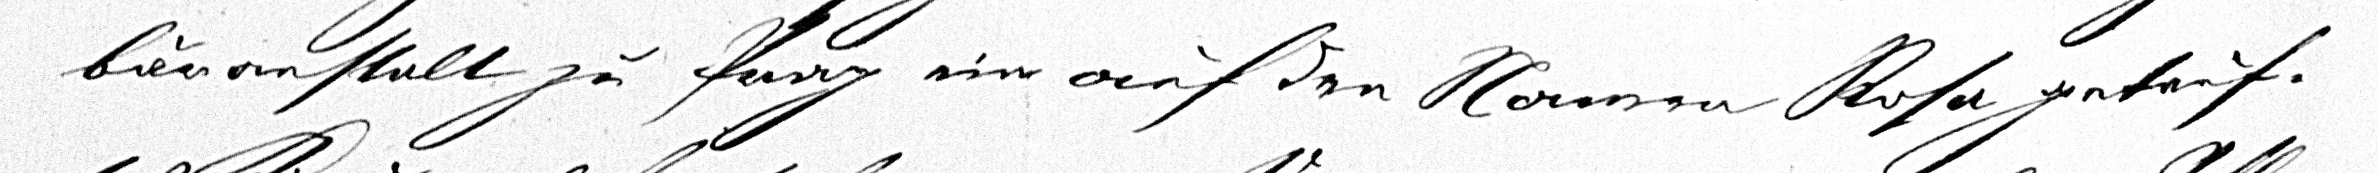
bxxanstalt zu Prag ein auf den Namen Rosa getauf¬
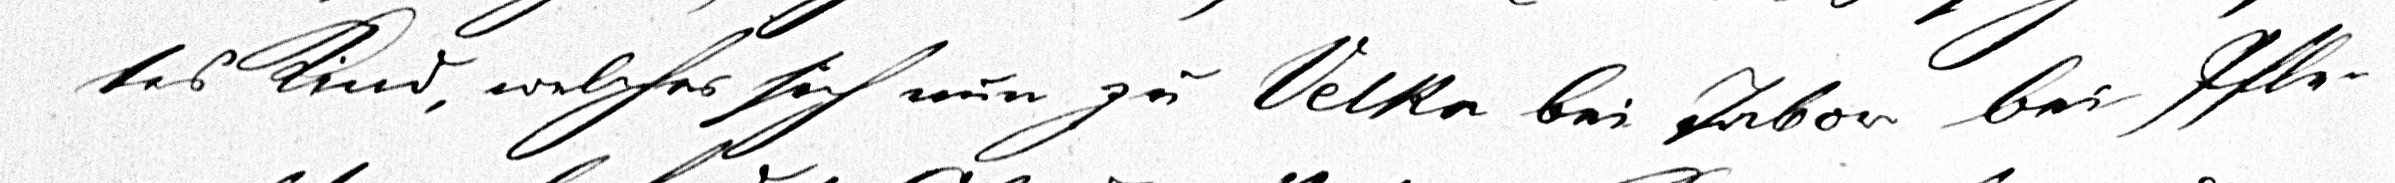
tes Kind, welches sich nun zu Velka bei Tabor bei Pfle¬
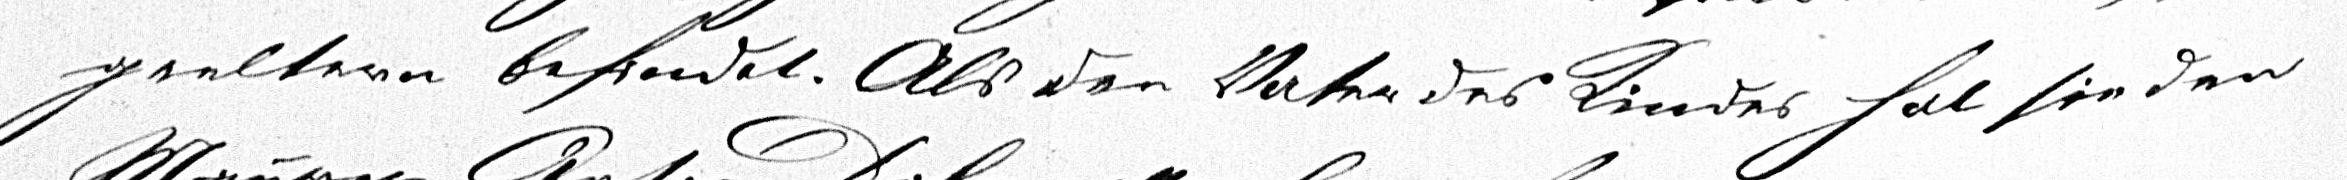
geeltern befindet. Als den Vater des Kindes hat sie den
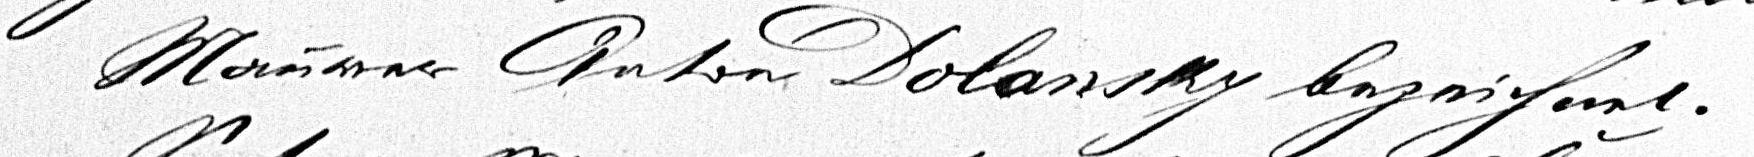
Maurer Anton Dolansky bezeichnet.
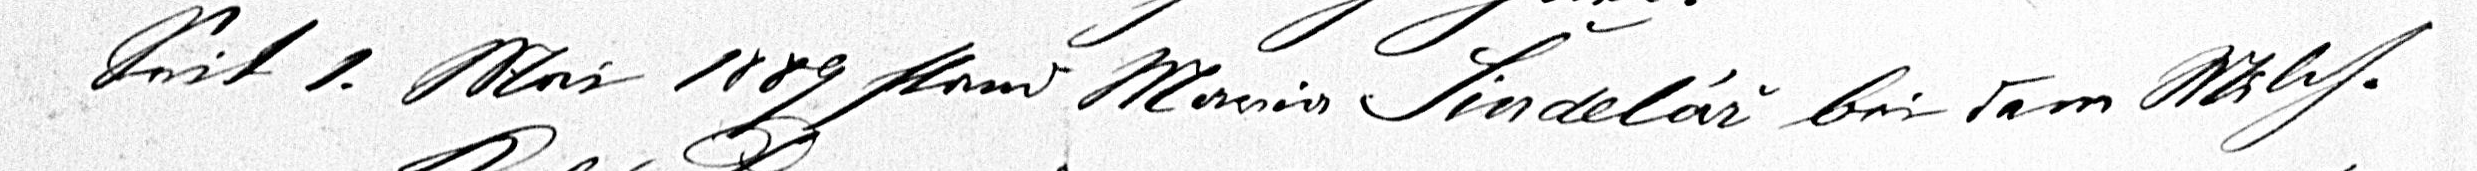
Seit 1. Mai 1889 stand Maria Šindelař bei dem Milch.
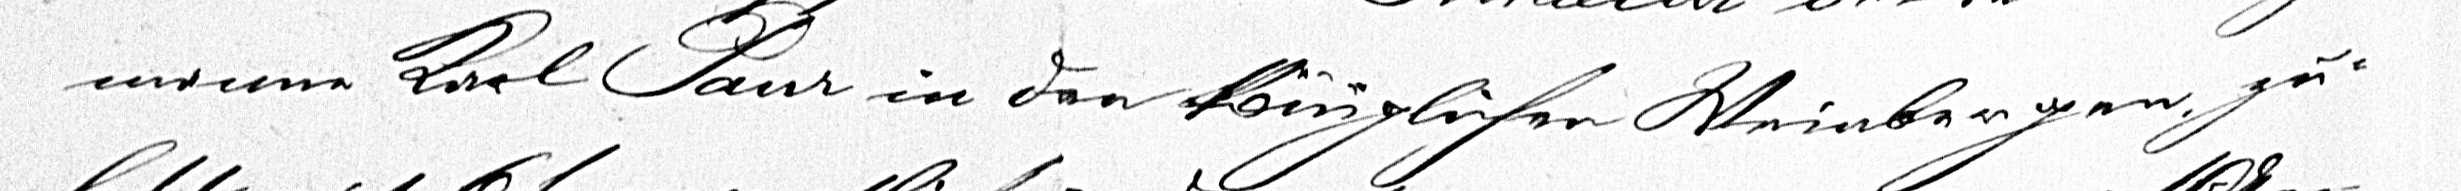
xx Karl Paur in den xxplichen Weinbergen zu¬
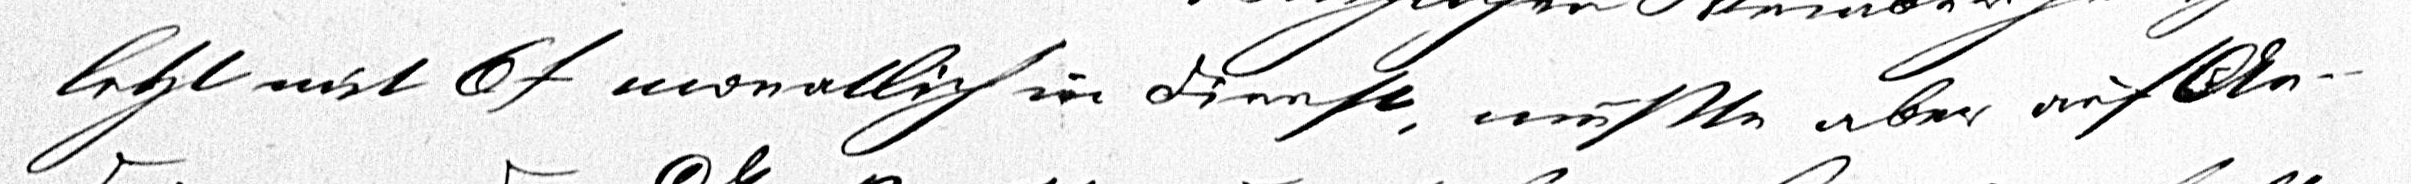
letzt mit 6f monatlich in Dienst, mußte aber auf An¬
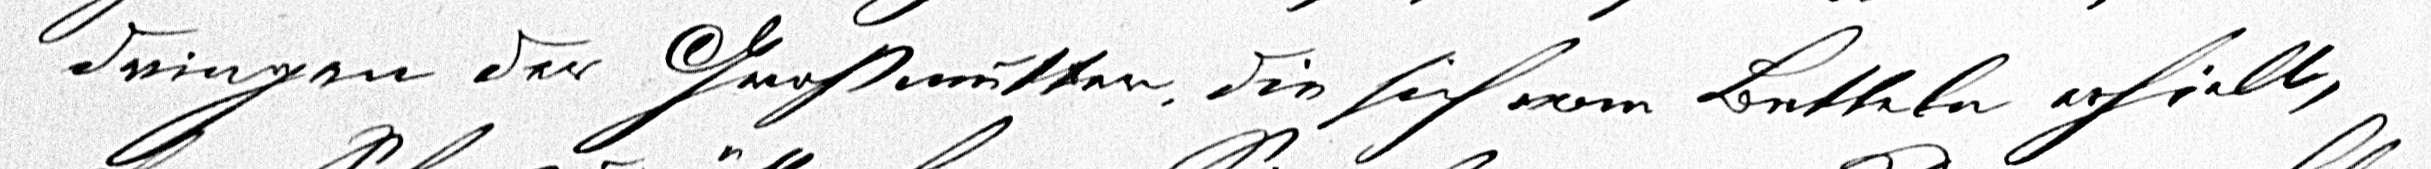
dringen der Großmutter, die sich vom Betteln erhielt,
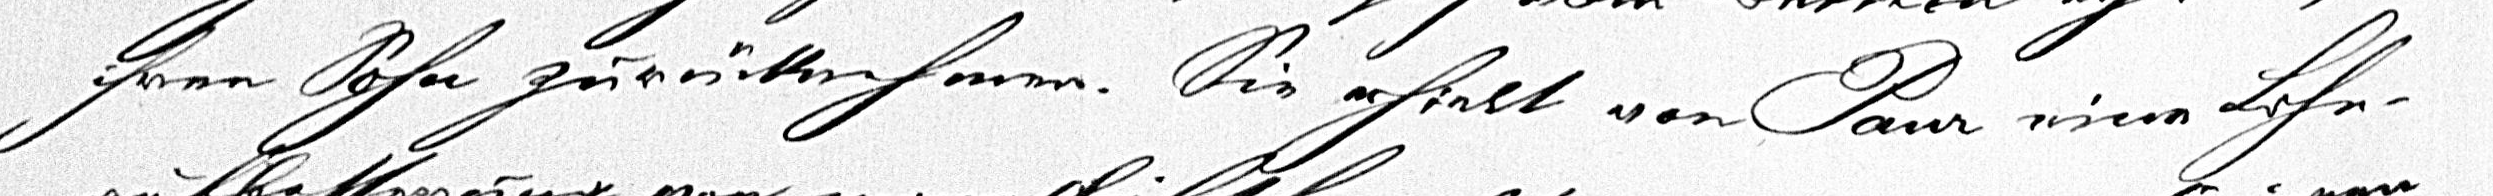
ihren Sohn zurücknehmen. Sie erhielt von Paur eine Lehn¬
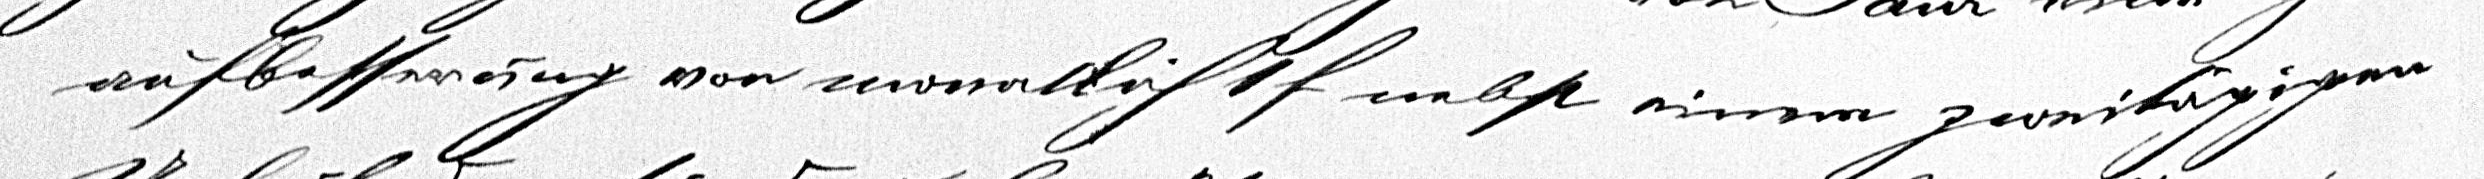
aufbesserung von monatlich 1f nebst einem zweitägigen
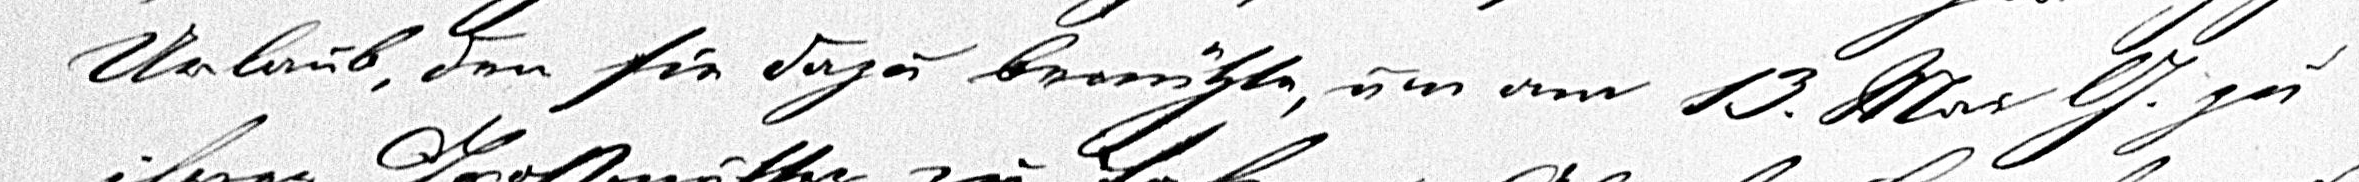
Urlaub, den sie dazu benützte, um am 13. Mai G. zu
